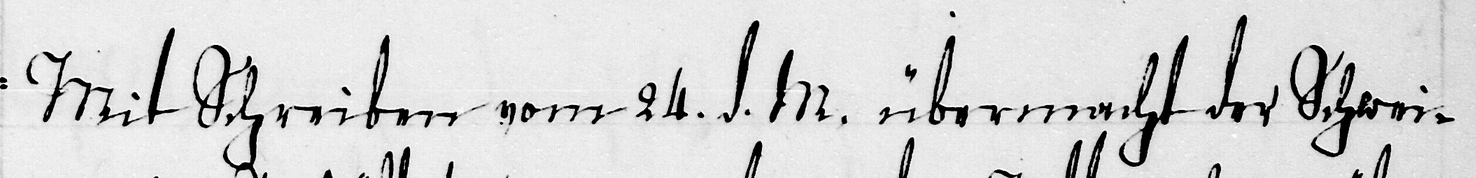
Mit Schreiben vom 24. d. M. übermacht der Schwei¬
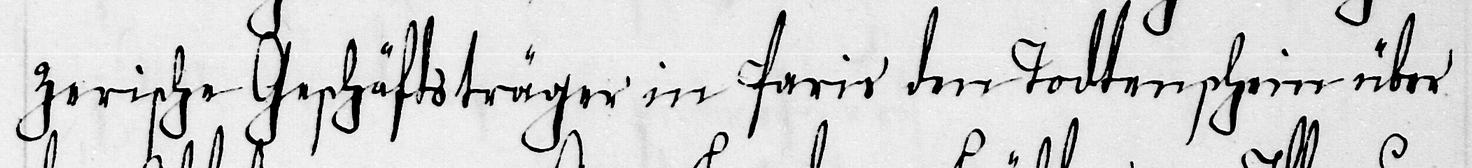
zerische Geschäftsträger in Paris den Todtenschein über
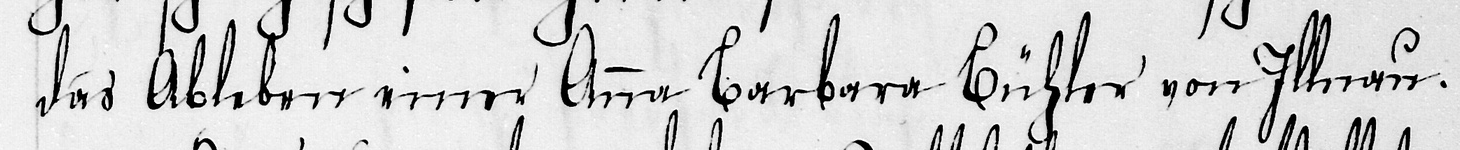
das Ableben einer Anna Barbara Bühler von Illnau.
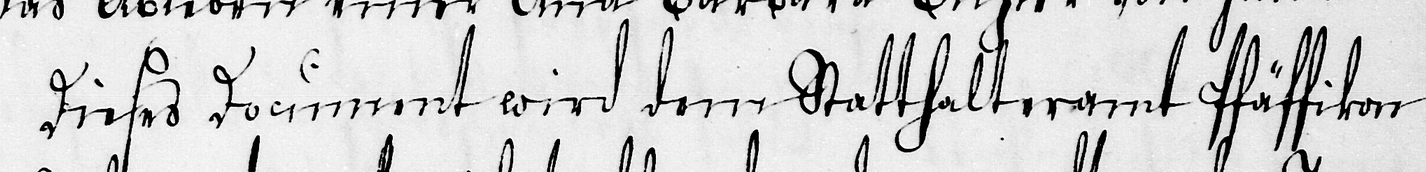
Dieses Document wird dem Statthalteramt Pfäffikon
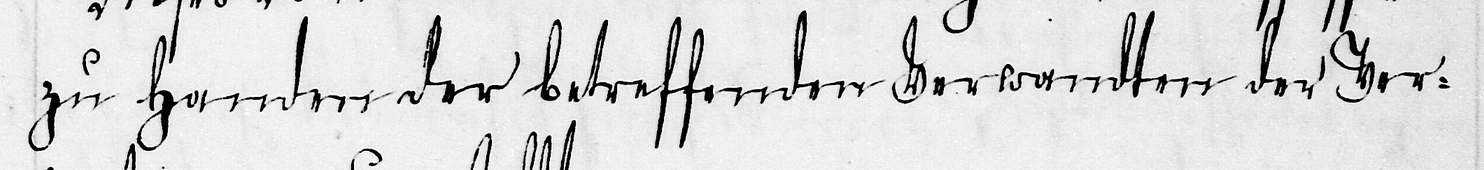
zu Handen der betreffenden Verwandten der Ver¬
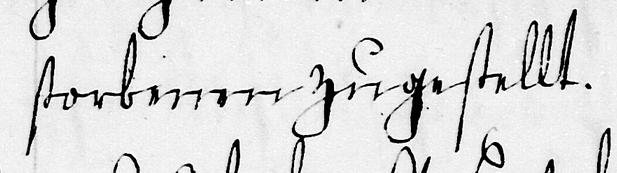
storbenen zugestellt.
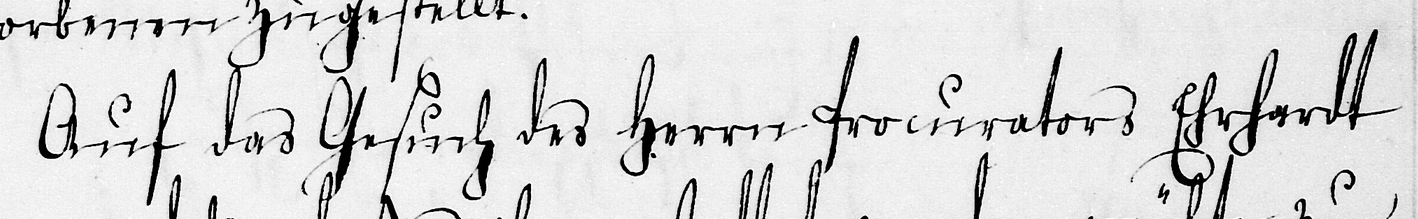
Auf das Gesuch des Herrn Procurators Ehrhardt
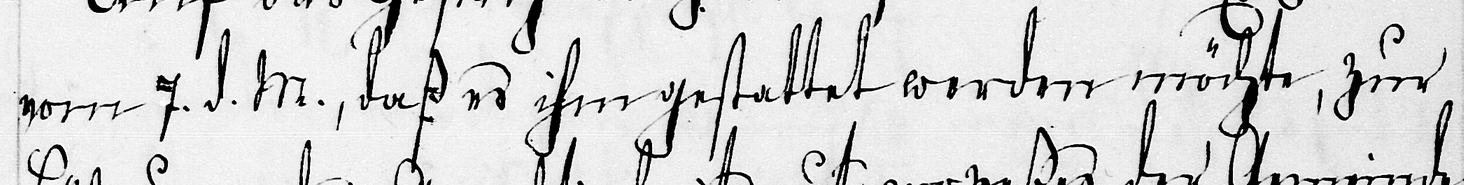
vom 7. d. M., daß es ihm gestattet werden möchte, zur
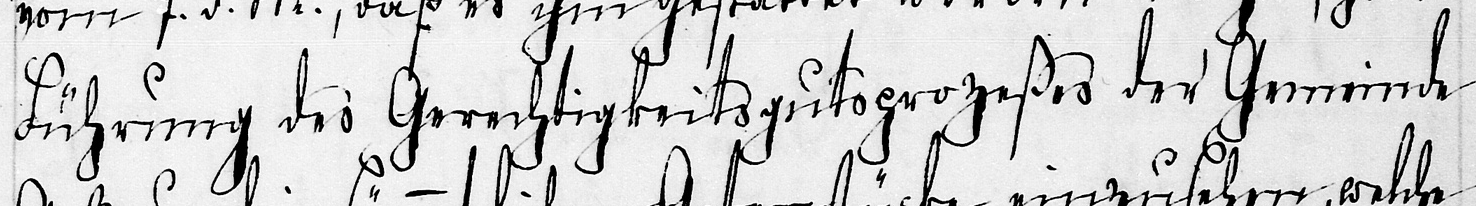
Führung des Gerechtigkeitsgutsprozeßes der Gemeinde
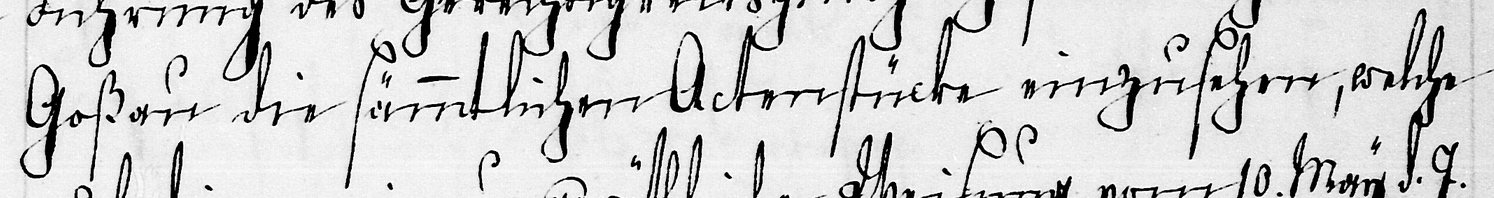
Goßau die sämmtlichen Actenstücke einzusehen, welche
